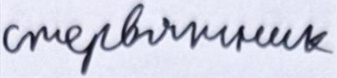стервятник
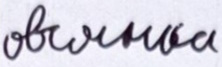овсянка
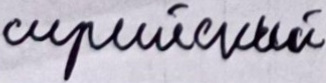сирийский
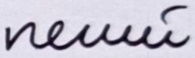пегий
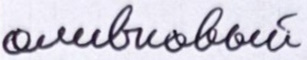оливковый
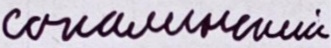сахалинский
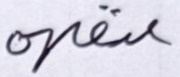орёл
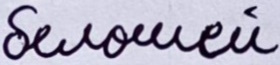белошей
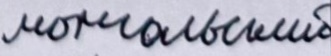монгольский
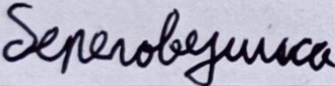береговушка
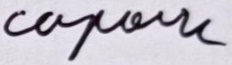сарык
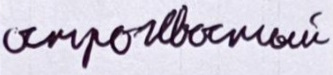острохвостый
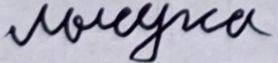лысуха
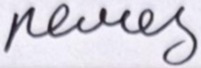ремез
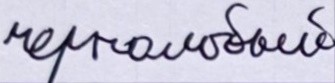чернолобый
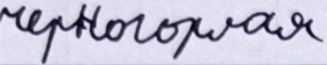черногорлая
